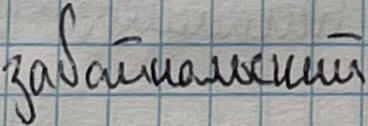забайкальский
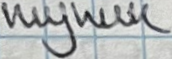тупик
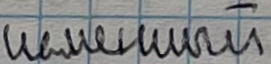каменный
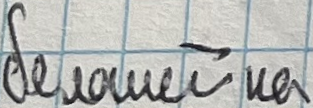белошейка
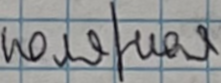полярная
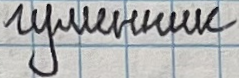гуменник
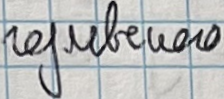годлевского
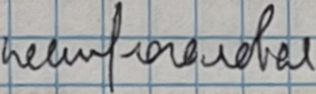пестроголовая
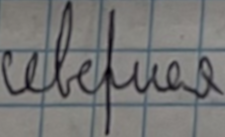северная
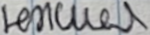южная
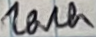гага
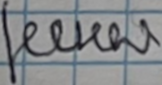речная
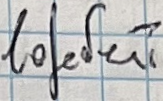воробей
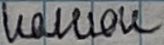канюк
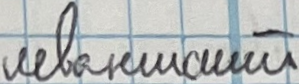левантский
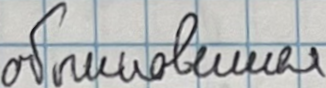обыкновенная
